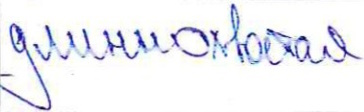длиннохвостая
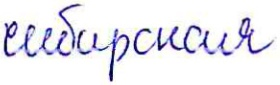сибирская
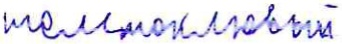телстоклювый
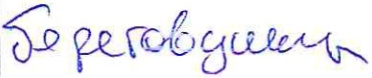береговушка
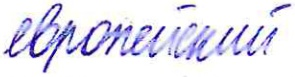европейский
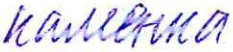каменка
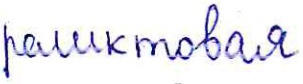реликтовая
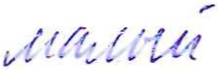малый
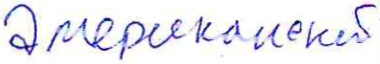американский
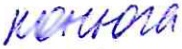конюга
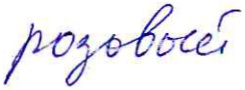розовый
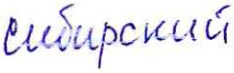сибирский
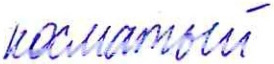косматый
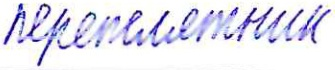перепелятник
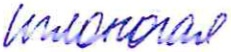иглоногая
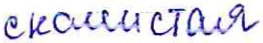скалистая
